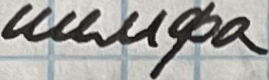нимфа
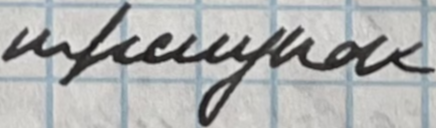трескунок
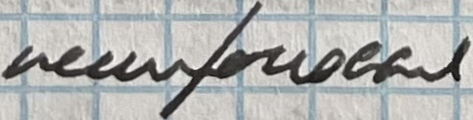пестроносая
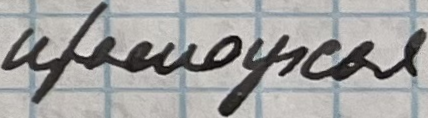красноухая
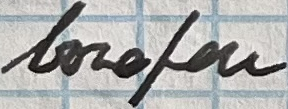вьюрок
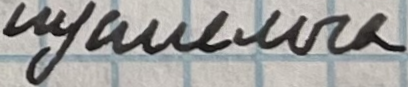пустельга
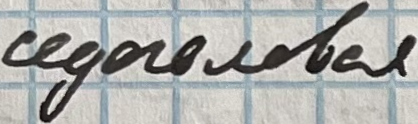седоголовая
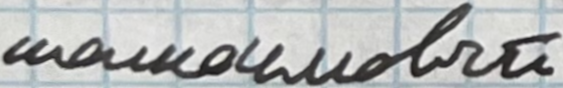тонкоклювый
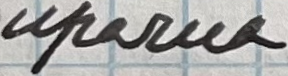крачка
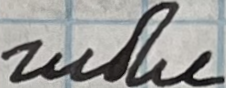чибис
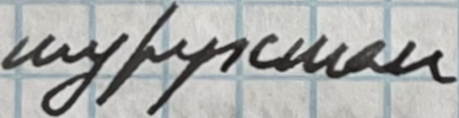турухтан
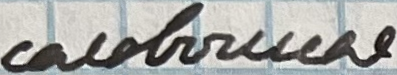соловьиная
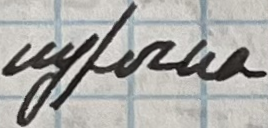курочка
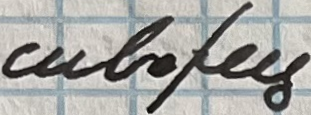скворец
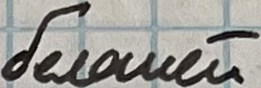белошей
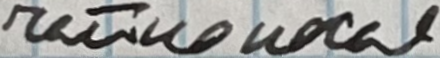чайконосая
